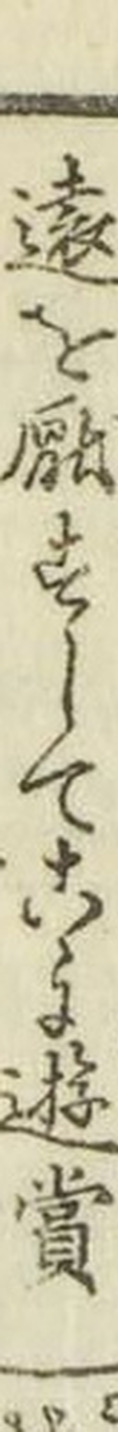遠を厭すしてこゝに遊賞
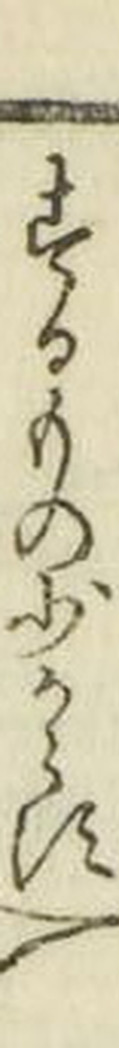するもの少からす
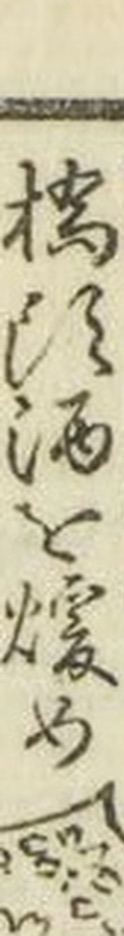橋頭酒を煖め
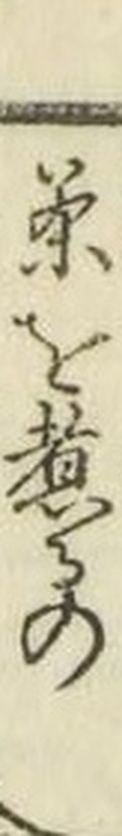茶を煮るの
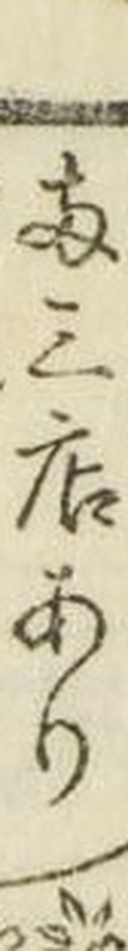両三店あり
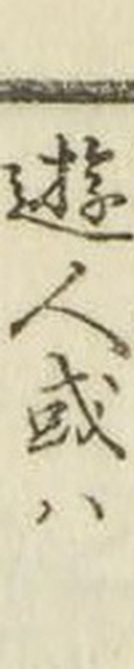遊人或は
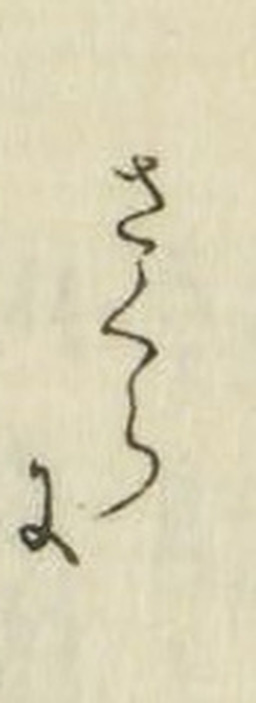さくらに
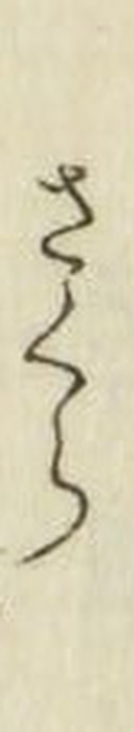さくらに
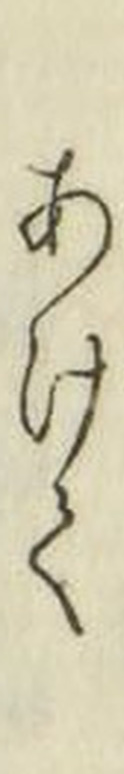あけて
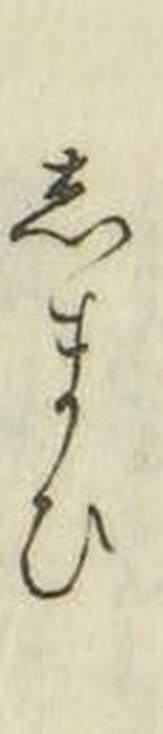しまひ

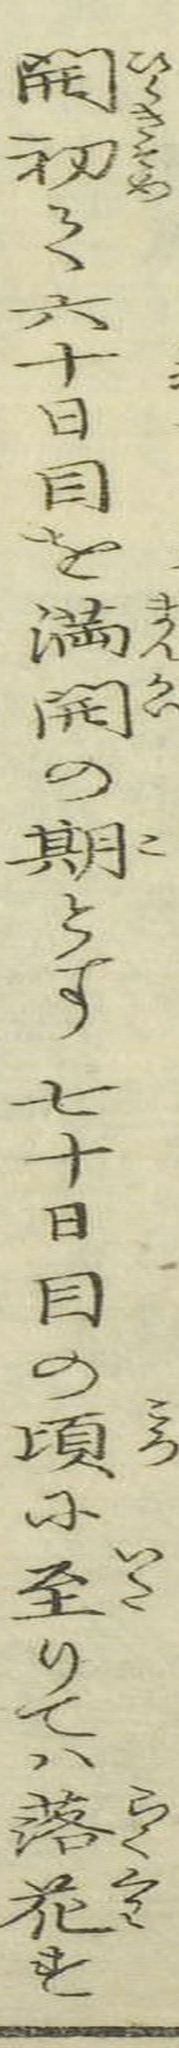開初て六十日目を満開の期とす七十日目の頃に至りては落花す
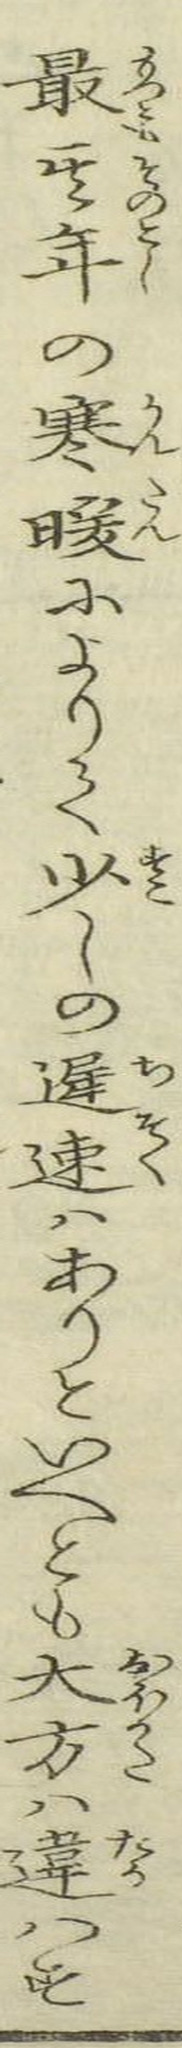最其年の寒暖によりて少しの遅速はありといへとも大方は違はす
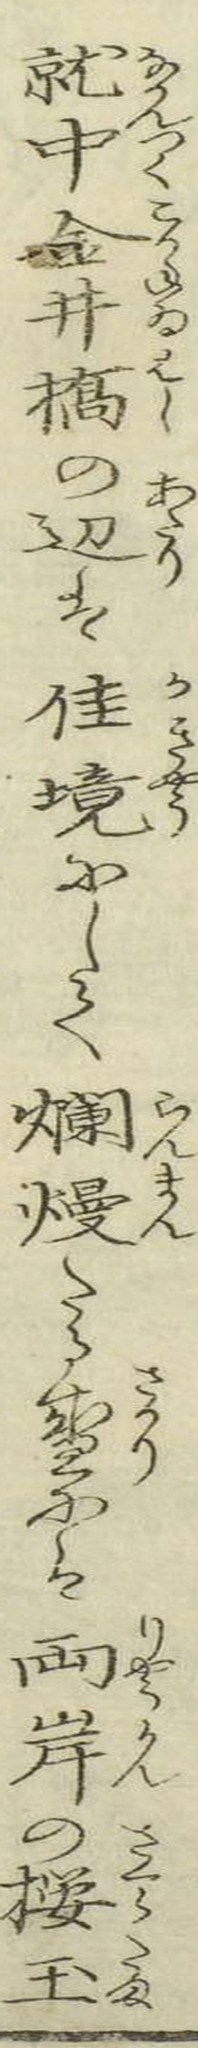就中金井橋の辺は佳境にして爛漫たる盛には両岸の桜玉
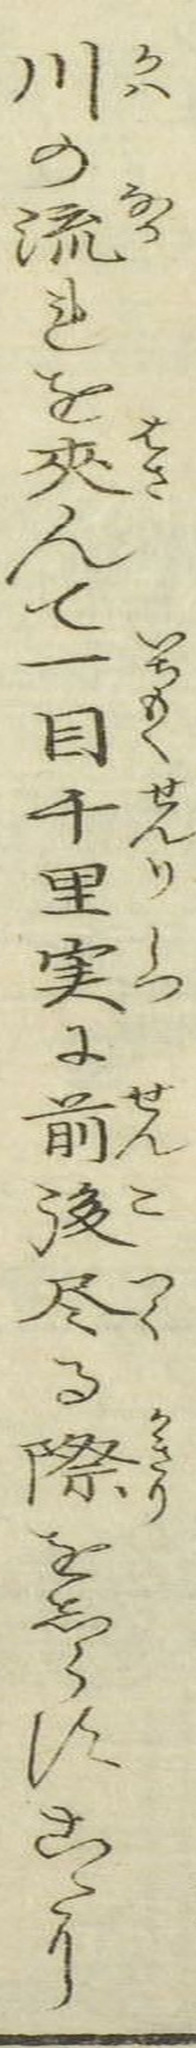川の流れを夾んて一目千里実に前後尽る際をしらすこゝに
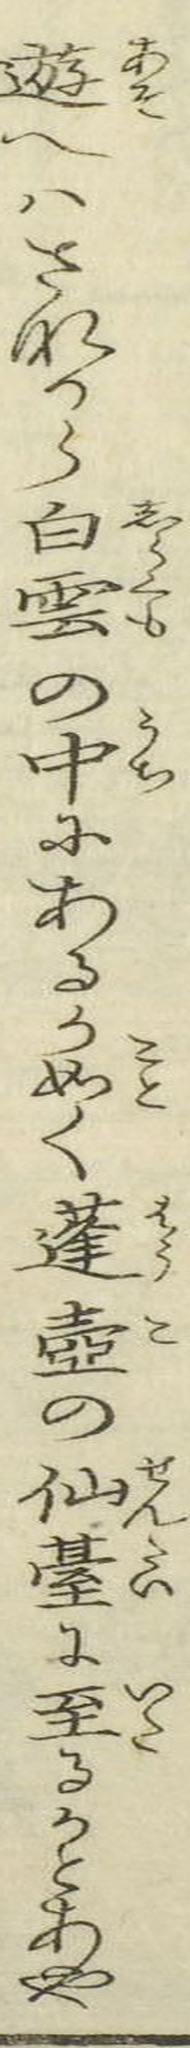遊へはさなから白雲の中にあるか如く蓬壺の仙台に至るかとあや
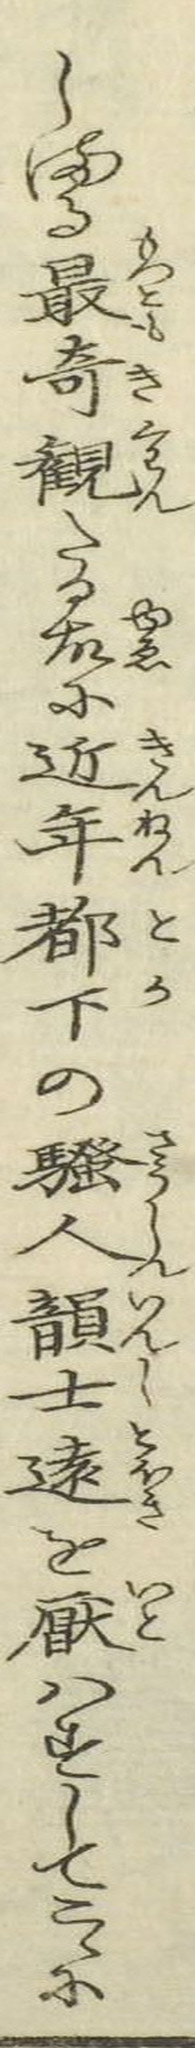しまる最奇観たる故に近年都下の騒人韻士遠を厭はすしてこゝに
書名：江戸名所図会 20巻 巻之11
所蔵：東京学芸大学教育コンテンツアーカイブ
